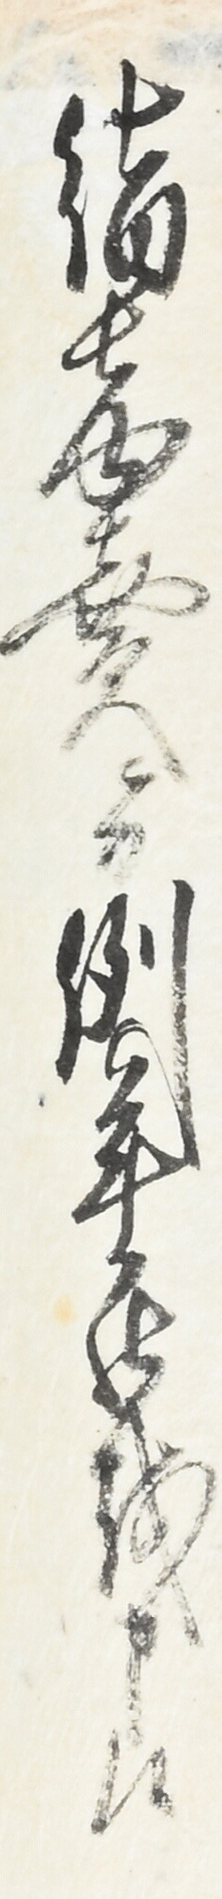書商売ニ而例年罷越申候
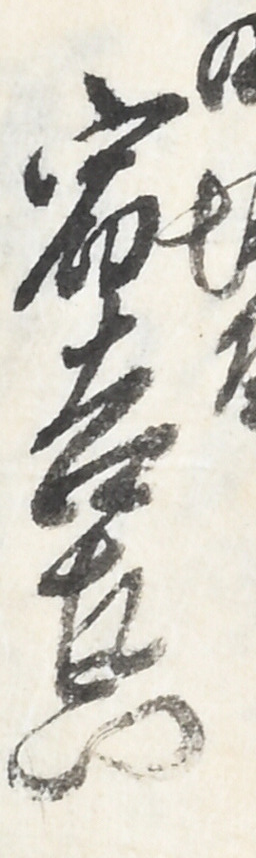宿金右衛門
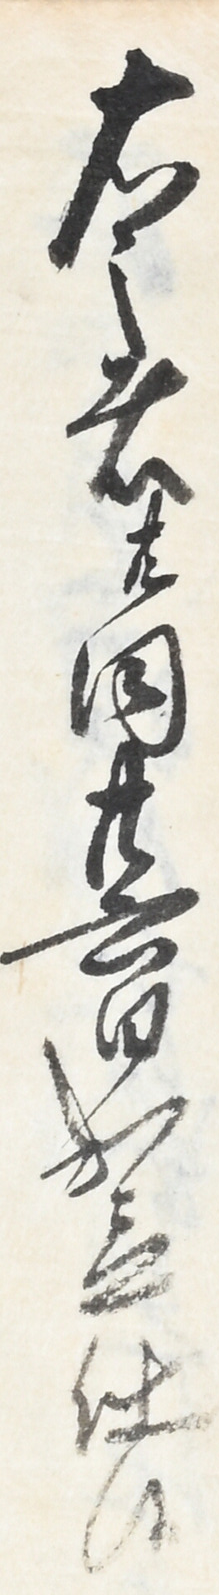右之者共同廿三日出立仕候

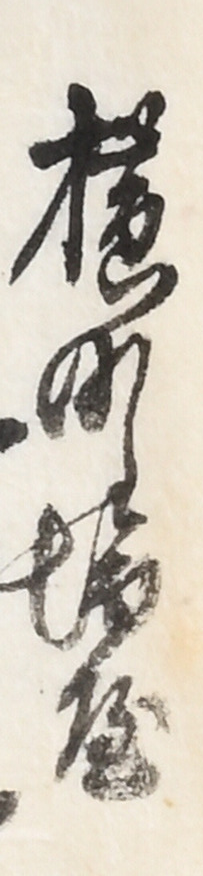横町塩屋
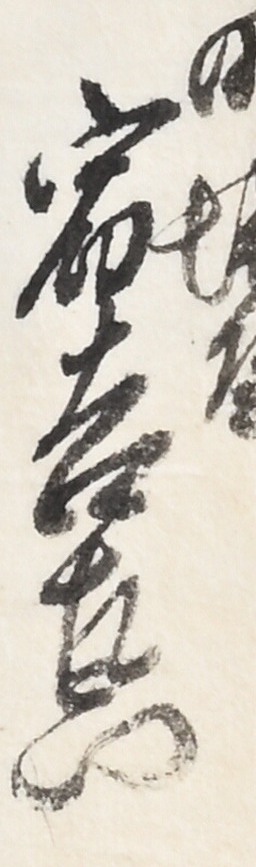宿吉左衛門
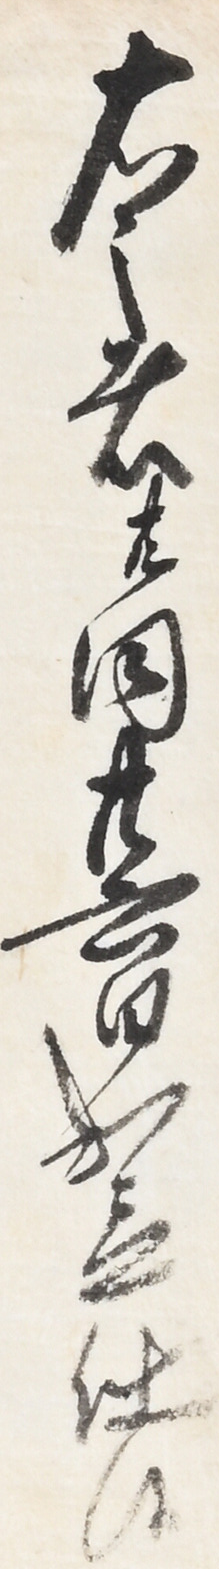右之者共同廿六日出立仕候
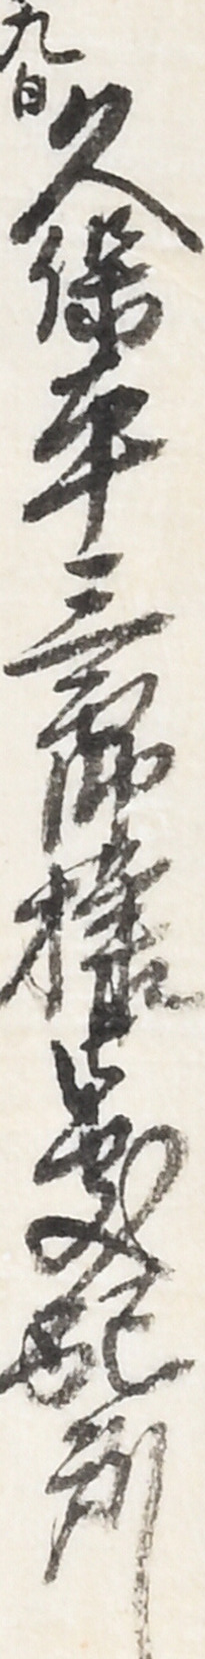久保平三郎様御支配所
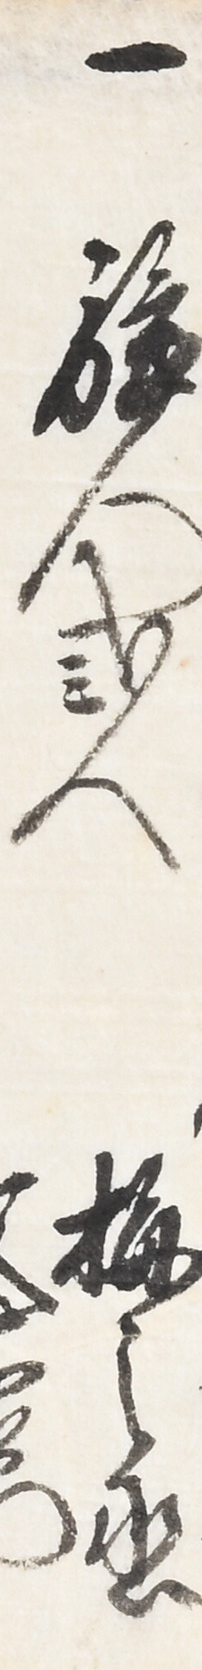一旅人弐人梅之丞
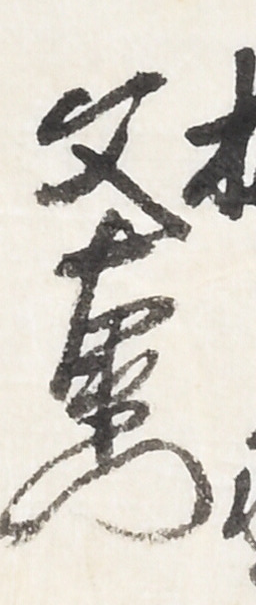文右衛門
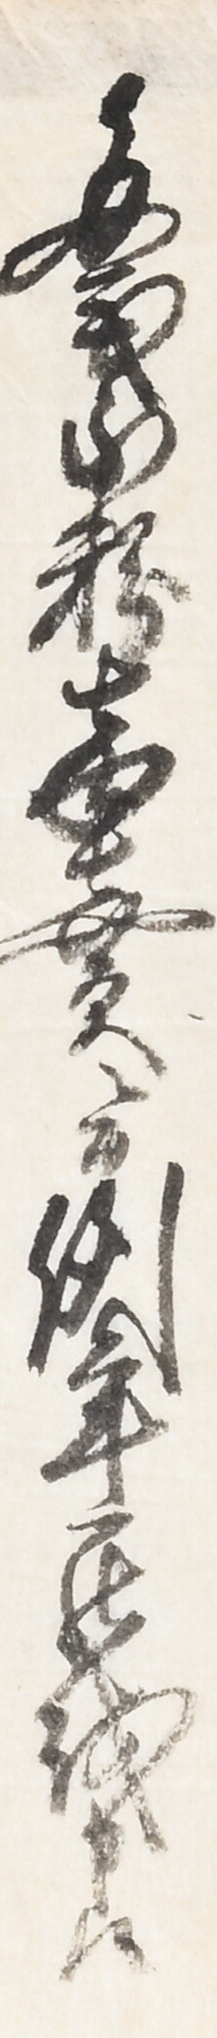毎茂不粉商売ニ而例年罷越申候
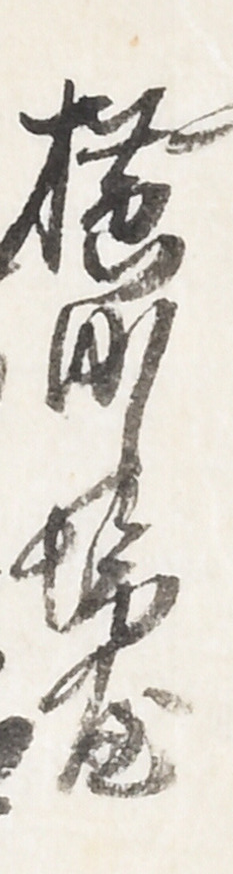横町塩屋
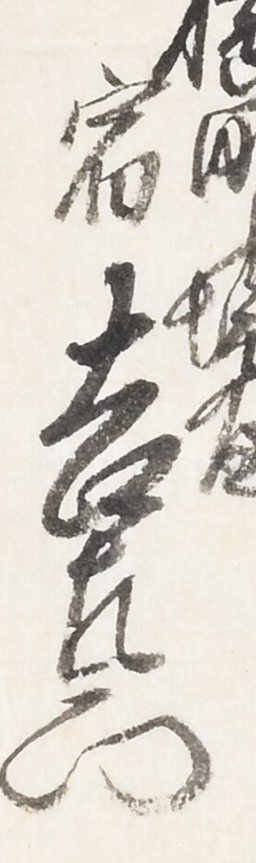宿吉左衛門
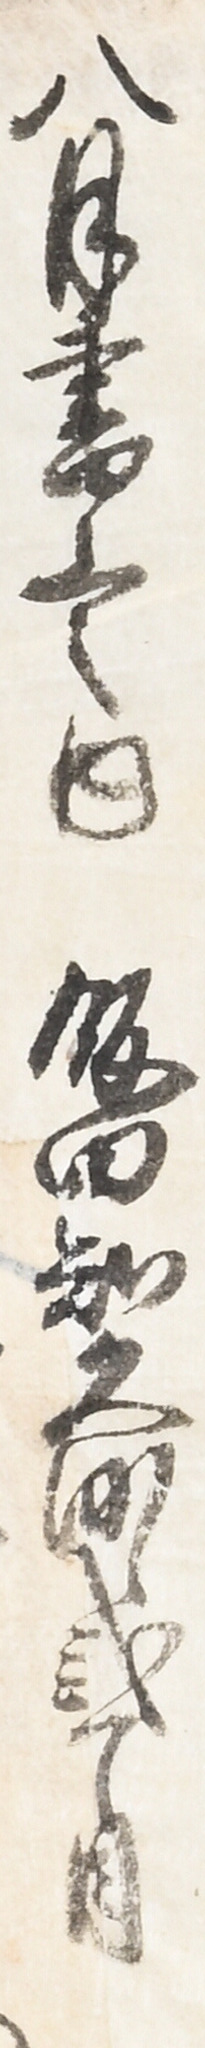八月書上之内飯田知久町弐丁目
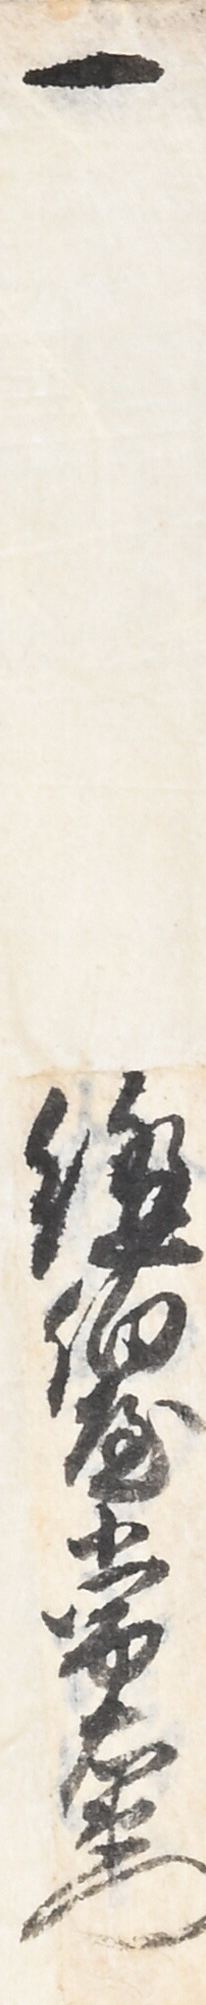一縫伯屋常右衛門
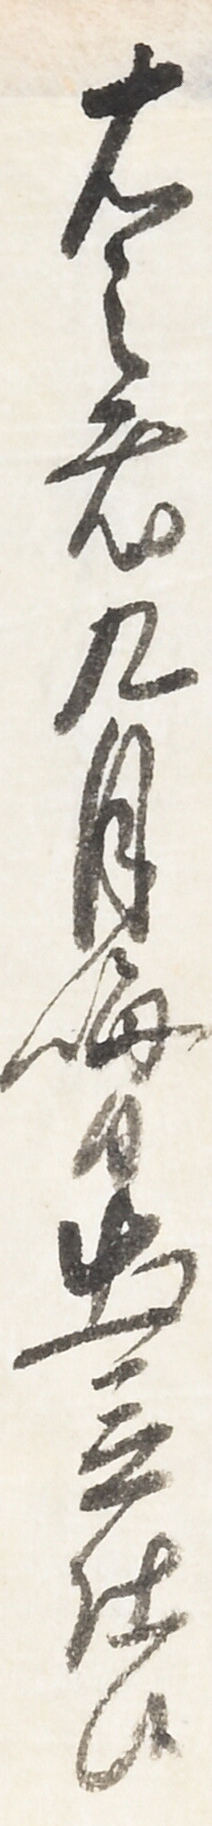右之者九月晦日出立仕候
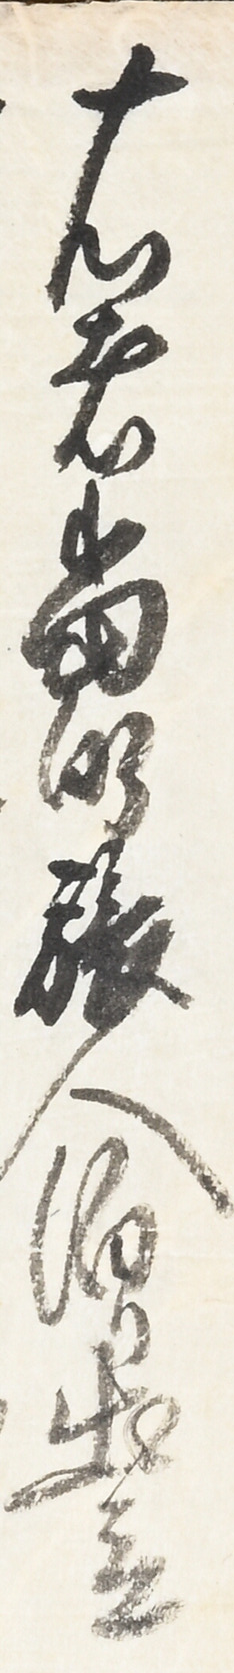右者当町旅人泊り出立
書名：旅人泊控帳
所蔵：伊那市立高遠町図書館・合同会社AMANE
